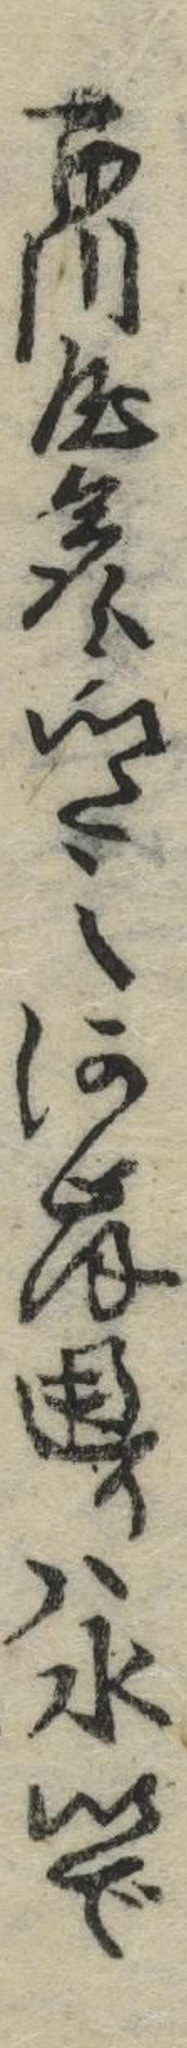百川屋多分いたミ河岸通りハ水いで
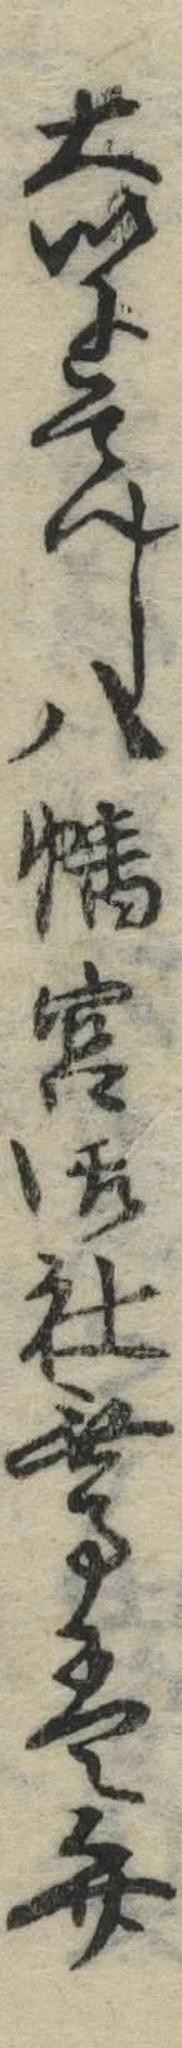大いにそんし八幡宮御社無事にて弁
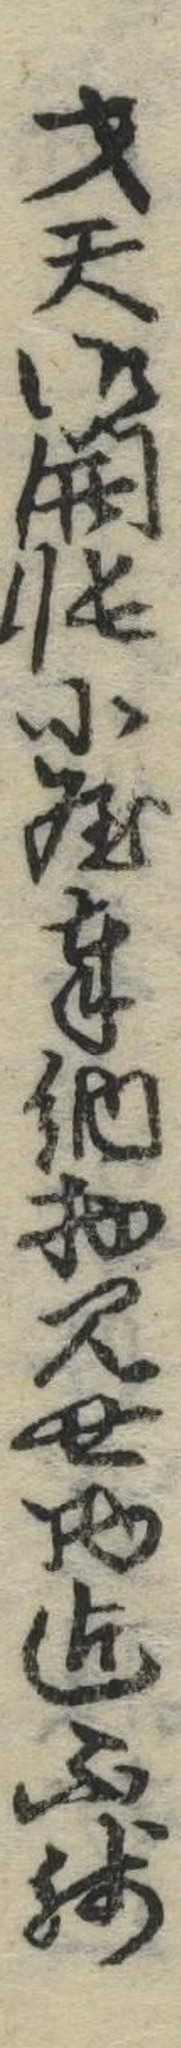才天御開帳小屋奉納物見世物迄不残
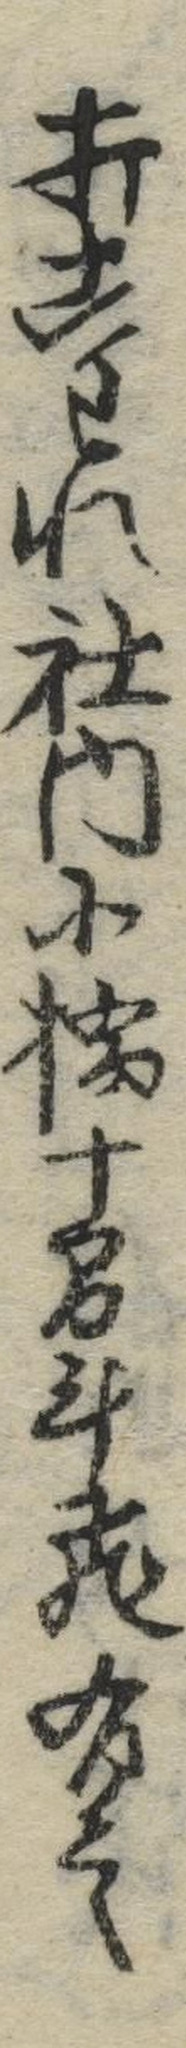打こわれ社内小橋十間斗飛有之
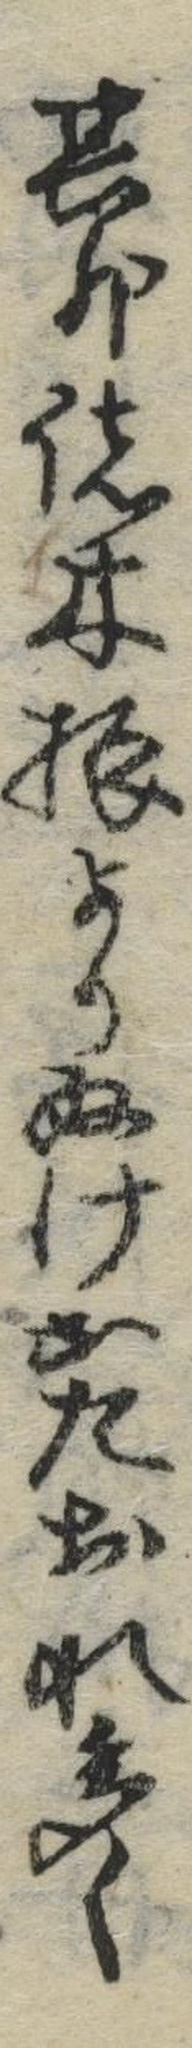其外諸木根よりぬけ出たおれ多く
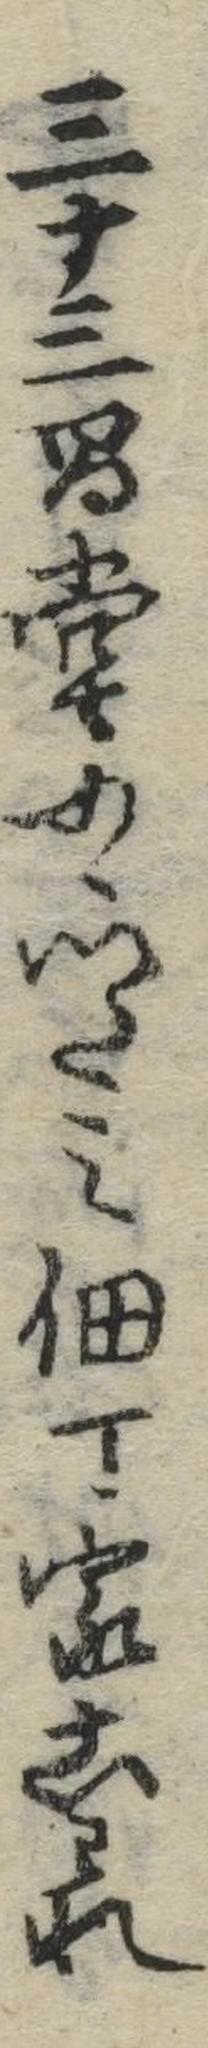三十三間堂少〻いたミ佃丁家こわれ
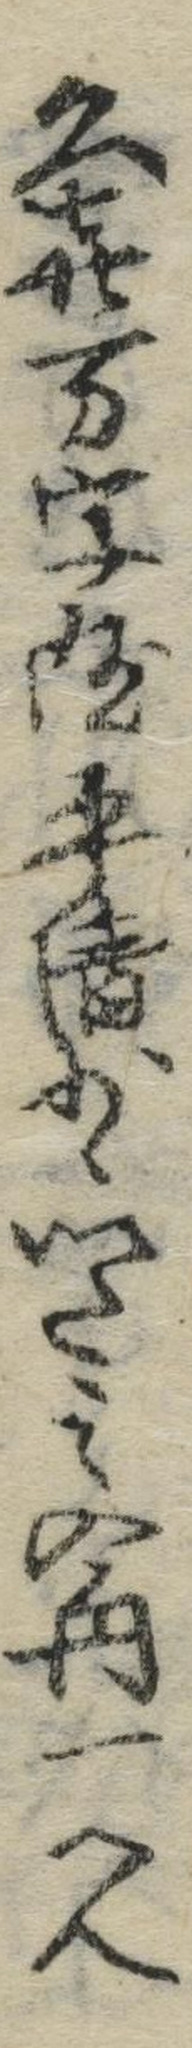久喜万字際平清少〻いたミ入舟一へん
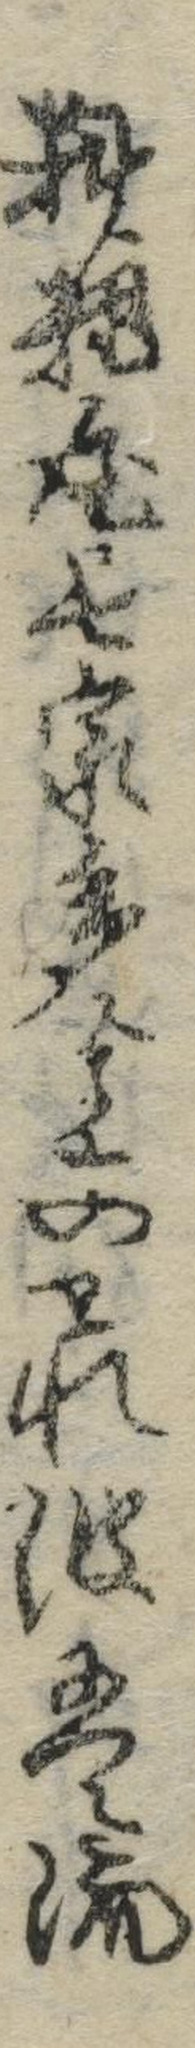料裡屋長家多分こわれ波にて流
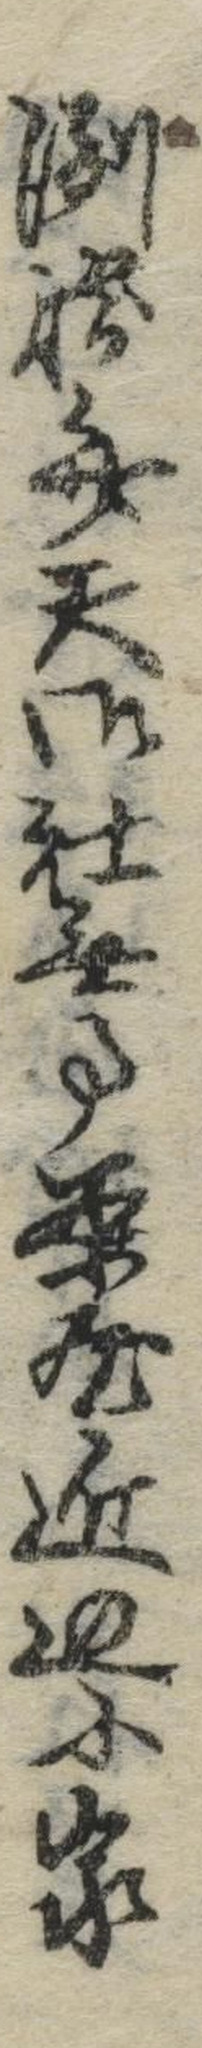洲崎弁天御社無事茶屋近辺小家
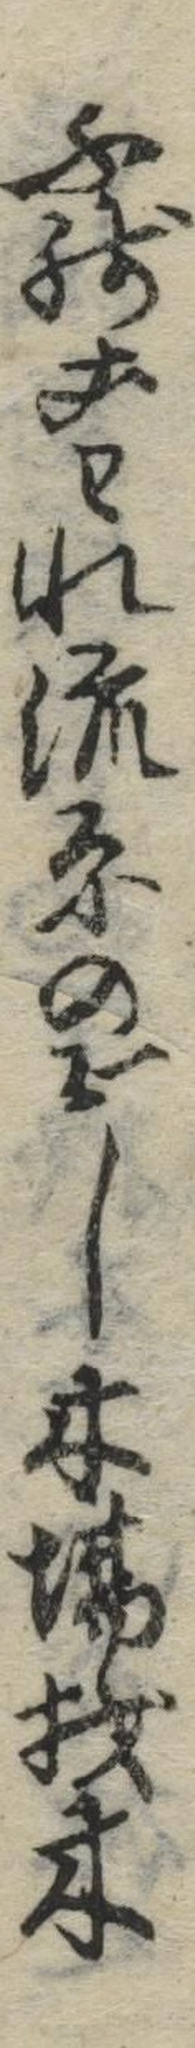不残こわれ流原の如し木場材木
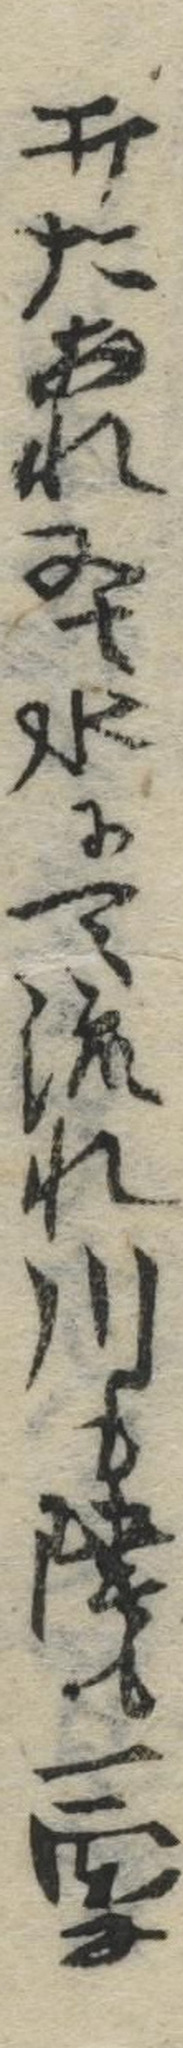打たおれ又は水にて流れ川も陸も一処
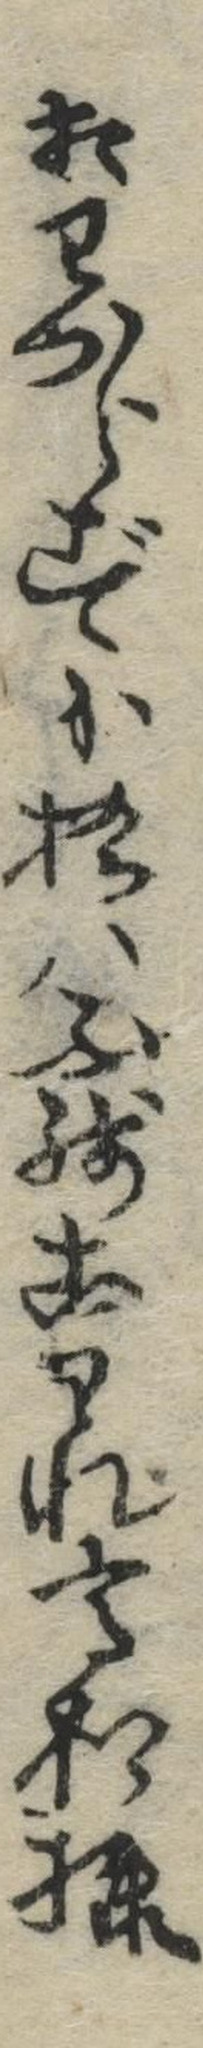相わからず小橋ハ不残こわれ高杉様
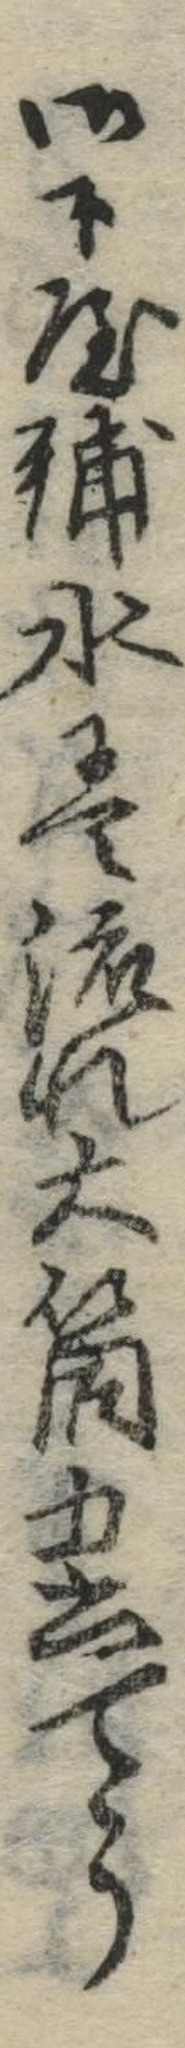御下屋舗水にて流れ大筒五六てう
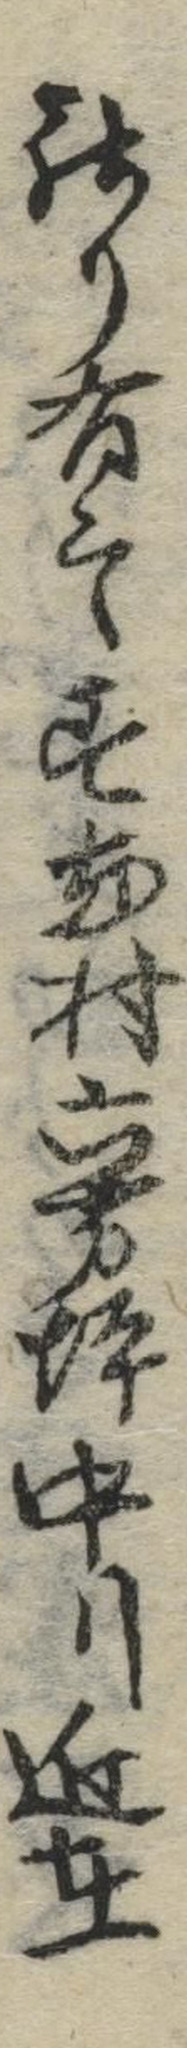残り有之すな村六万坪中引近在
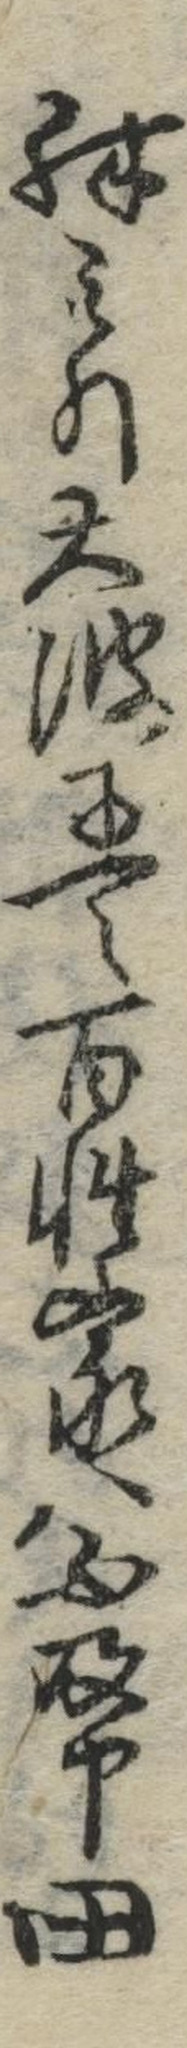殊之外大波にて百性家ハ不及申田
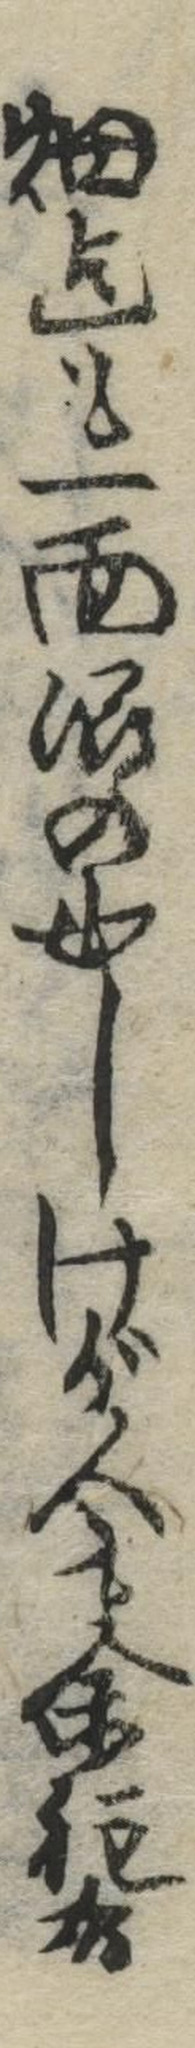畑迄も一面泥の如しけが人も余程有
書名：安政三年辰八月廿五日夜　大江都御屋敷方寺社市中共　大嵐水入場所明細書之寫　并街道筋近郷聞書
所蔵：東京大学地震研究所図書室 Earthquake Research Institute Library, The University of Tokyo, JAPAN
